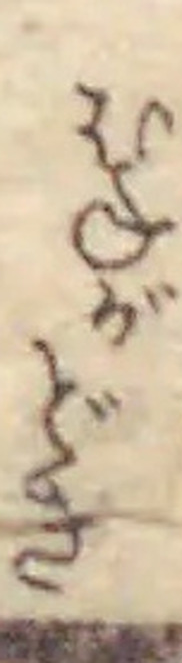むねがどき
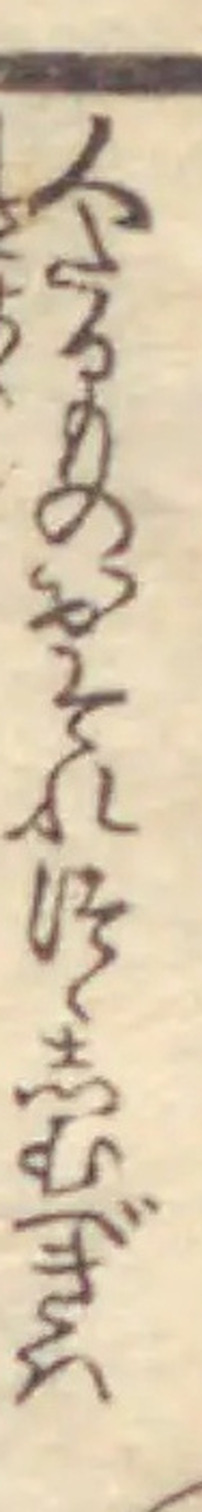人たるものおそれつゝしむべきは
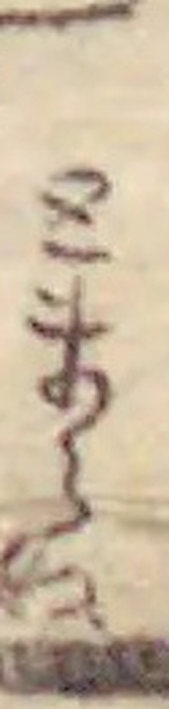とまらぬ
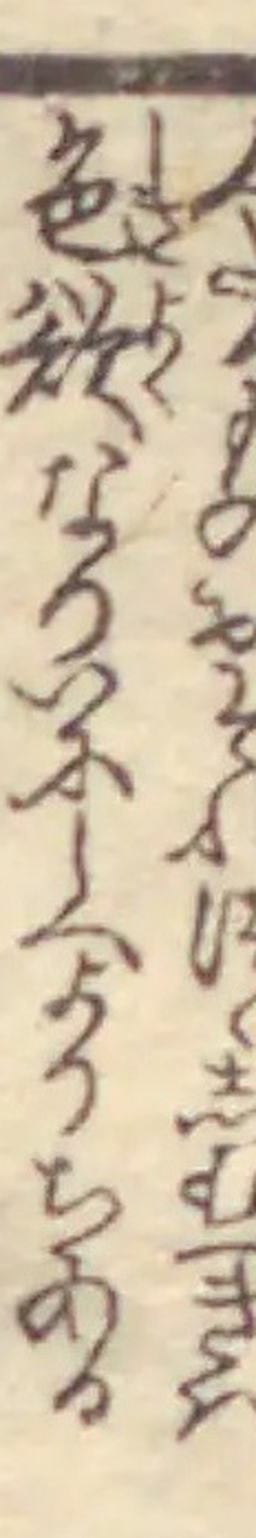色欲なりいにしへよりちある
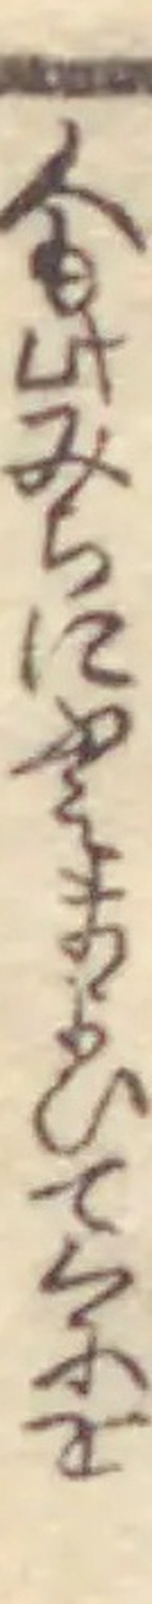人も此みちにふみまよひてくにを
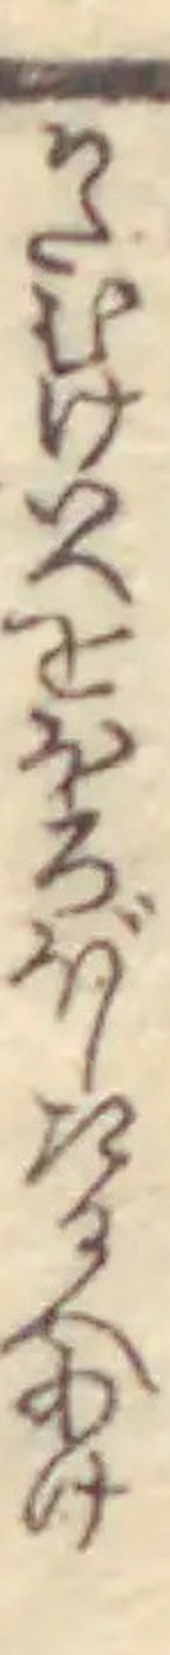かたむけいへをほろぼしたるひとあけ
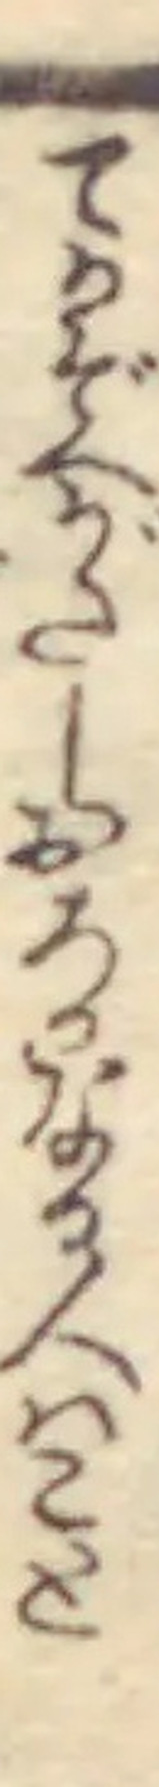てかぞへがたしおろかなる人はこと
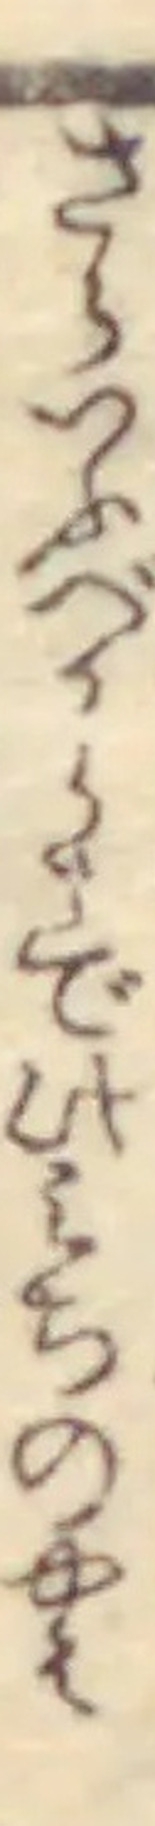さらいふべからず此みちのやみ
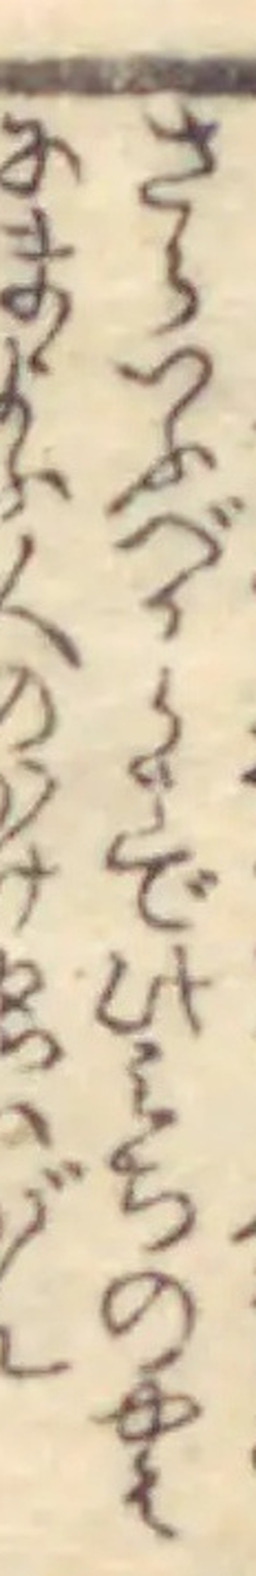にまよふ人のかけゑはぼん
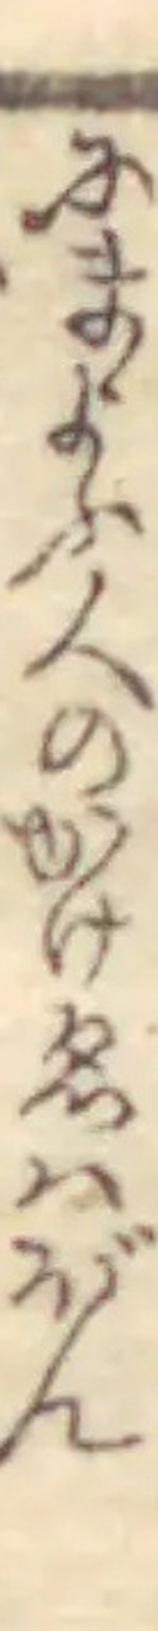にまよふ人のかけゑはぼん
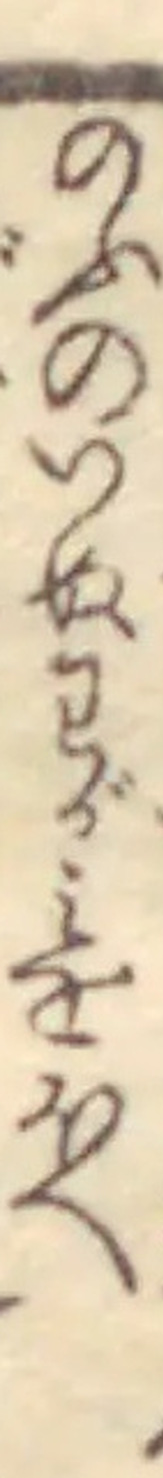のふのいぬわがみをほへ
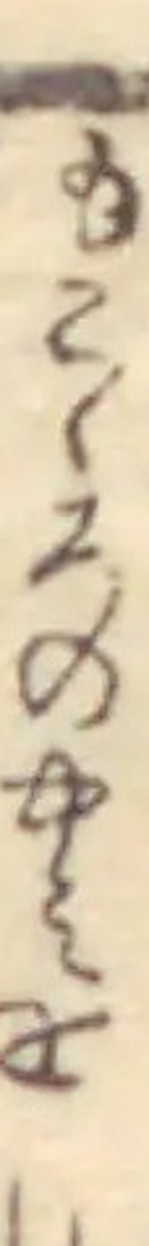もこゝろのやみを
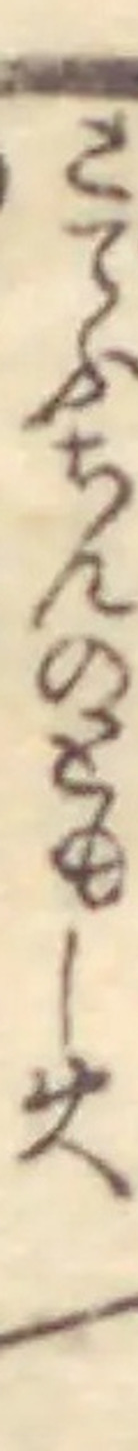こでふちんのともし火
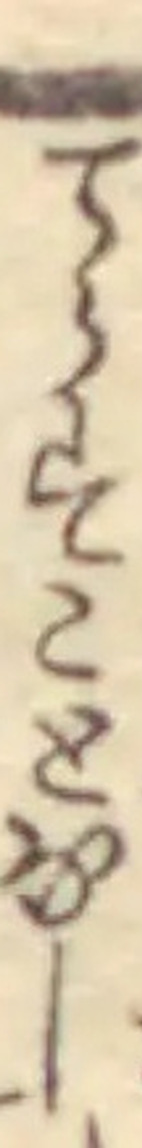てらすことなし
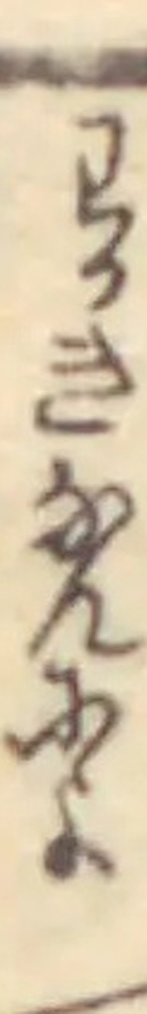わかきなんによ
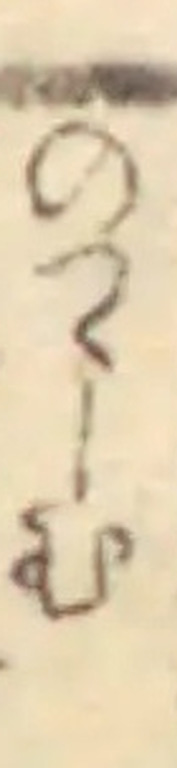のつゝしむ
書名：児訓影絵喩 3巻
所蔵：国立国会図書館 National Diet Library, JAPAN
